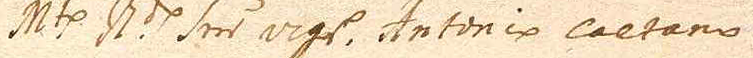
Mto R.do snr̄ vigr.o Antonio Caetano
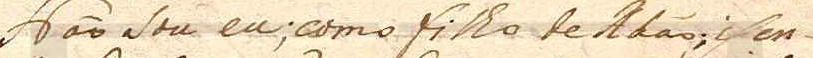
Não Sou eu; como filho de Adão; isen
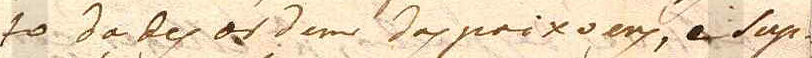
to da desordem das paixoens, e Sup
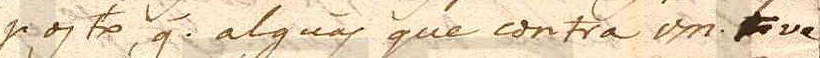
posto, que alguās que contra vm. teve
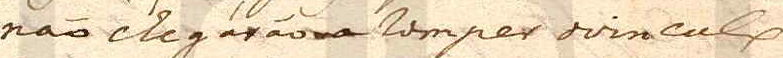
naõ chegarão a Romper o vinculo
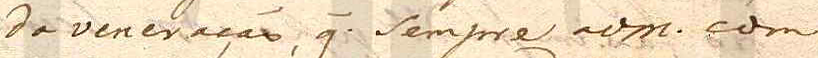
da veneração, q̄. Sempre a vm. com
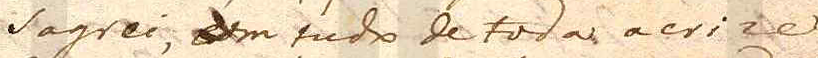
sagrei, comtudo de toda a crize
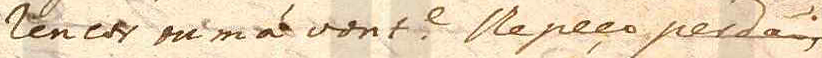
Rencor ou má vont.e lhe peço perdão;
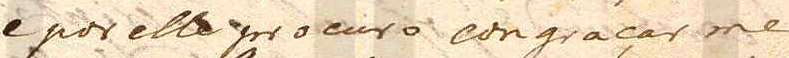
e por elle procuro congraçar me
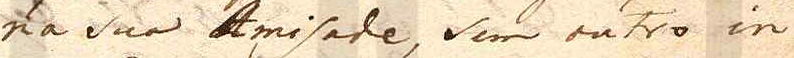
na Sua Amisade, sem outro in
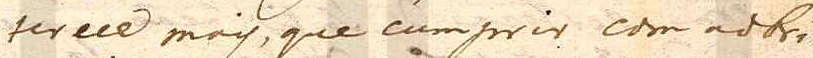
terece mais, que cumprir com a obri
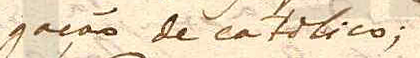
gação de catolico;
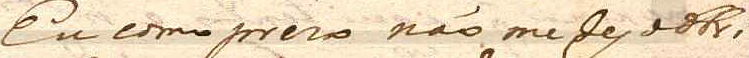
Eu como prezo não me desobbri
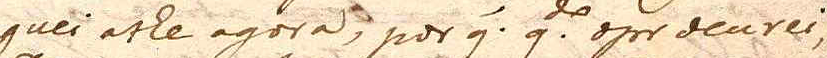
guei athe agora, por q̄. q.do o procurei,
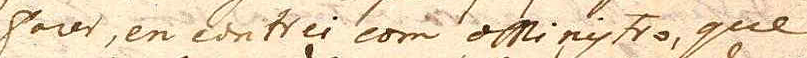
fazer, encontrei com o Ministro, que
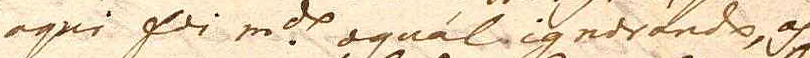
aqui foi m.do o qual ignorando, as
